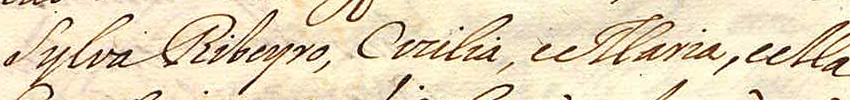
Sylva Ribeyro, Cezilia, e Maria, e ella
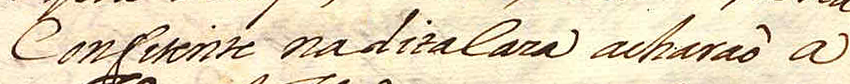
Confitente na dita Caza acharaõ a
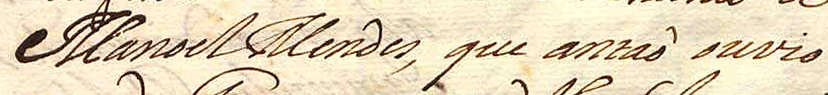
Manoel Mendes, que antaõ ouvio
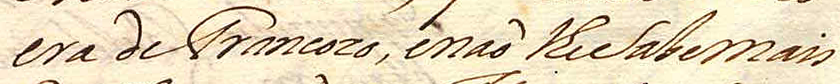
era de Trancozo, e naõ lhe sabe mais
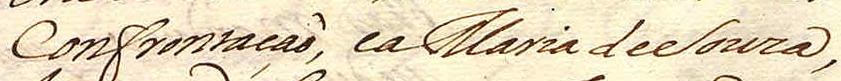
confrontaçaõ, e a Maria de Souza
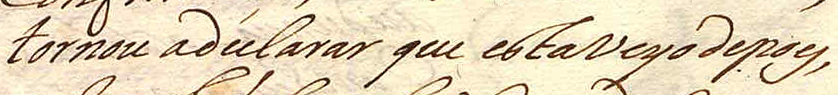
tornou a declarar que esta veyo depois,
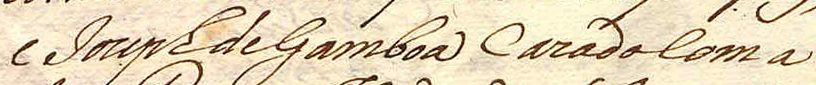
e Jozeph de Gamboa, cazado com a
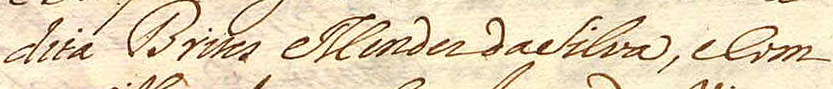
dita Brites Mendez da Silva, e Com
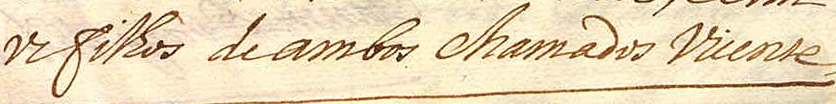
os filhos de ambos chamados Vicente
